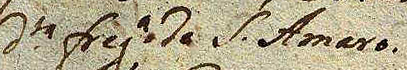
d.ta freg.a de S. Amaro.
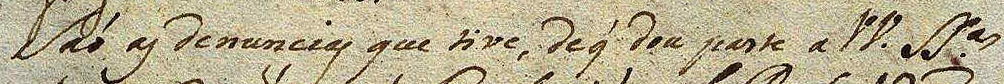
Saõ as denuncias que tive, de q̄ dou parte a VV. Ss.as
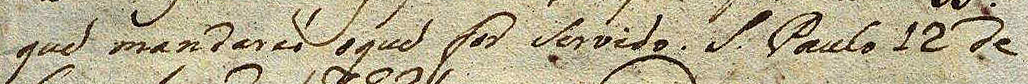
que mandaraõ o que for servido. S. Paulo 12 de
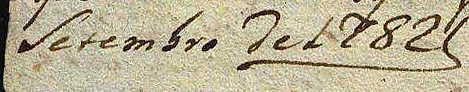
Setembro de 1782
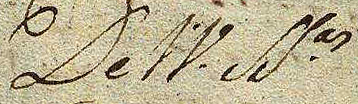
De VV. SS.as
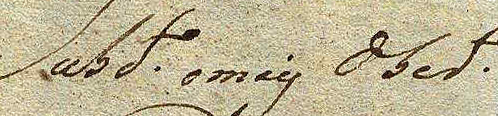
Subd.o o mais Obed̄.e
